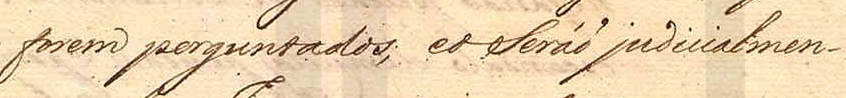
forem perguntados; e o Seraõ judicialmen
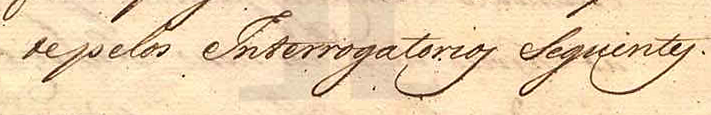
te pelos Interrogatorios Seguintes.
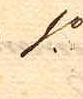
1.o
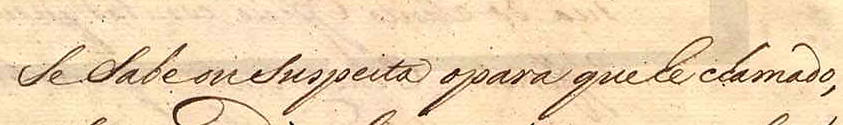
Se Sabe ou suspeita o para que he chamado,
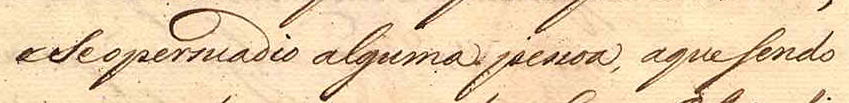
e se o persuadio alguma pessoa, a que sendo
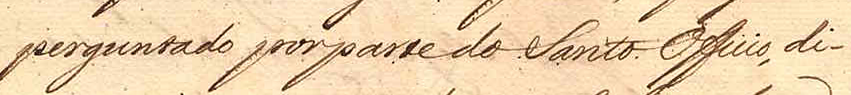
perguntado por parte do Santo Officio, di
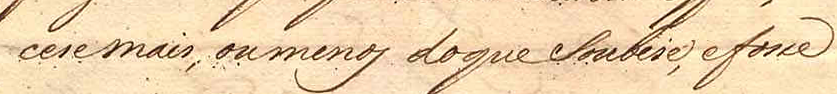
cese mais, ou menos do que Soubese, e fosse
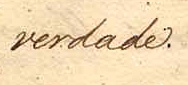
verdade.
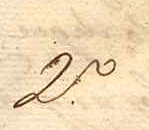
2.o
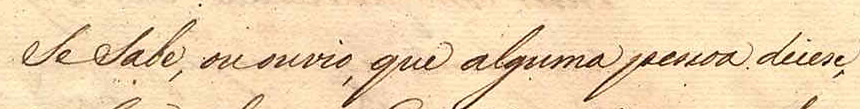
Se Sabe, ou ouvio, que alguma pessoa dicese,
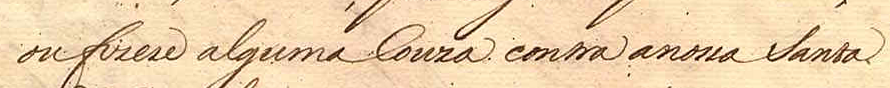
ou fizese alguma Couza contra a nossa Santa
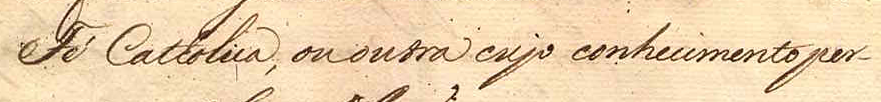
Fé Catholica, ou outra cujo conhecimento per
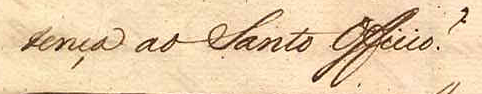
tença ao Santo Officio?
